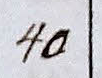40
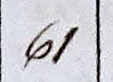61
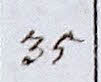35
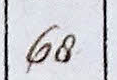68
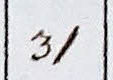31
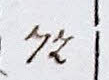72
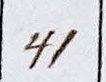41
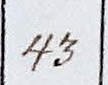43
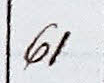61
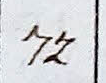72
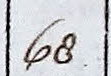68
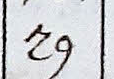29
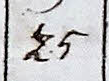25
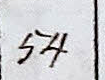54
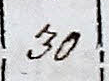30
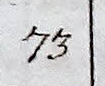73
